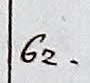62
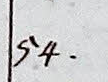54.
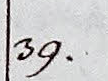39.
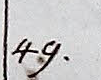49.
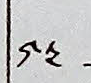52
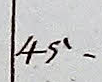45
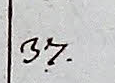37.
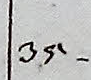35
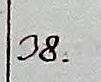38.
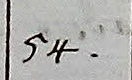54.
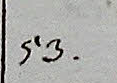53.
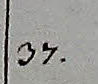37.
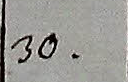30.
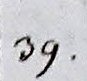39
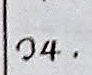34
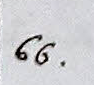66.
